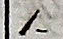1
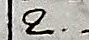2
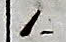1
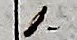1
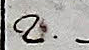2.
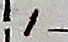1
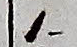1
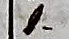1
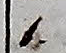1
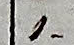1
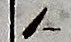1
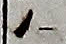1
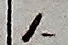1
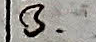3.
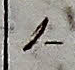1
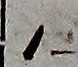1
